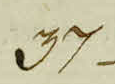37
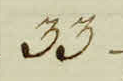33
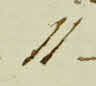11
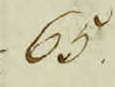65
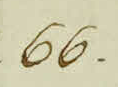66
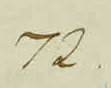72
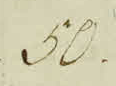50
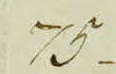75
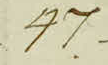47
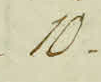10
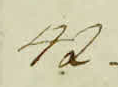42
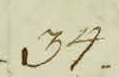34
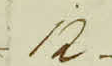12
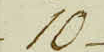10
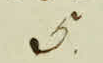5
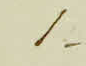1
